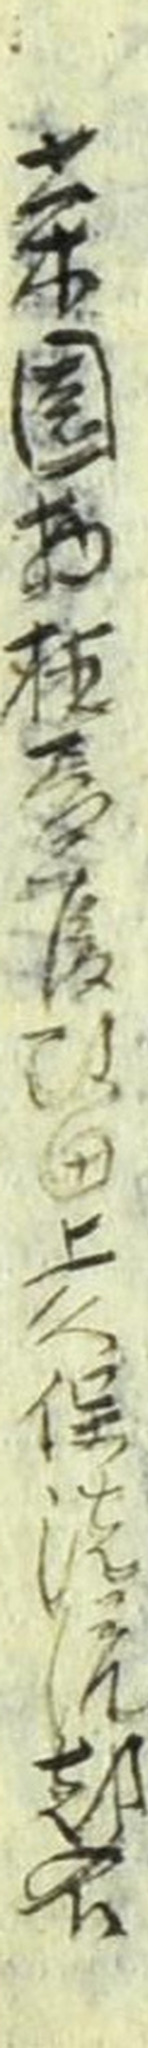九日曇菜園物植昼後改田上久保洗流都合

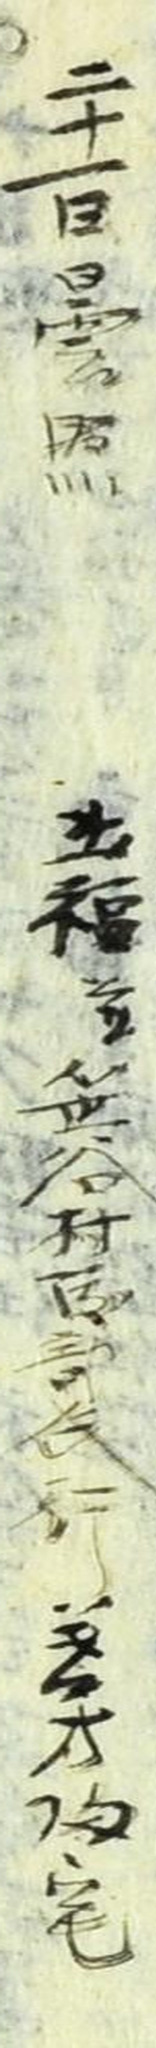○二十一日曇照出福幷笹谷村渡部氏行暮方帰宅
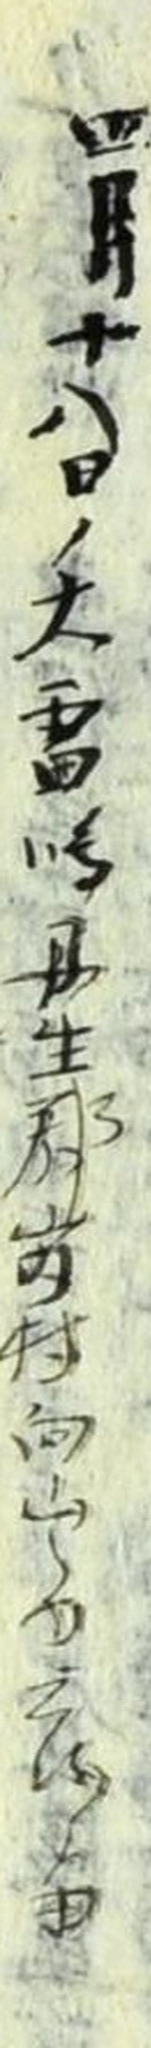四月十八日ノ大雷鳴丹生郡山内村向山之内ニ落候由
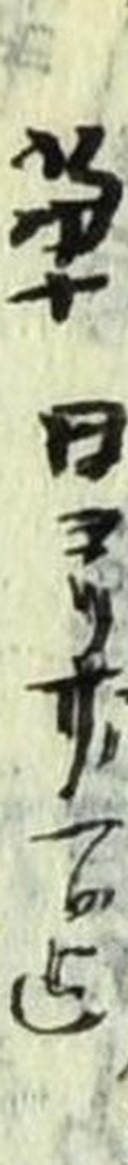当十日ヨリ廿一日迄
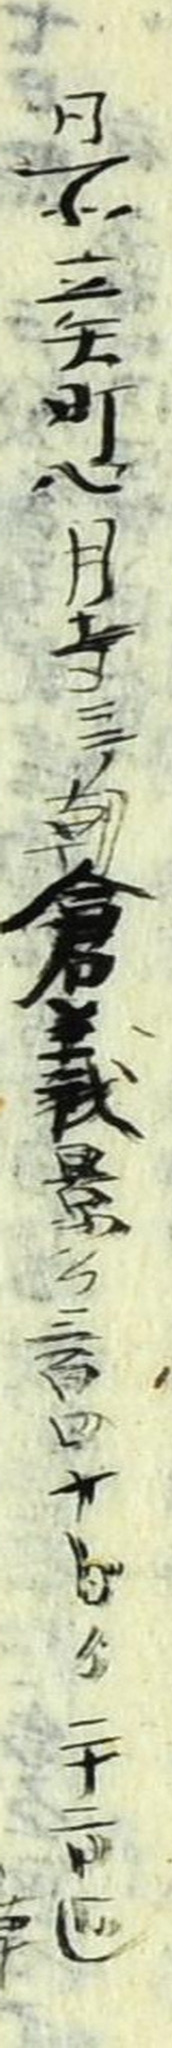同所立矢町心月寺ニテ朝倉義景公三百回廿日ゟ二十二日迄
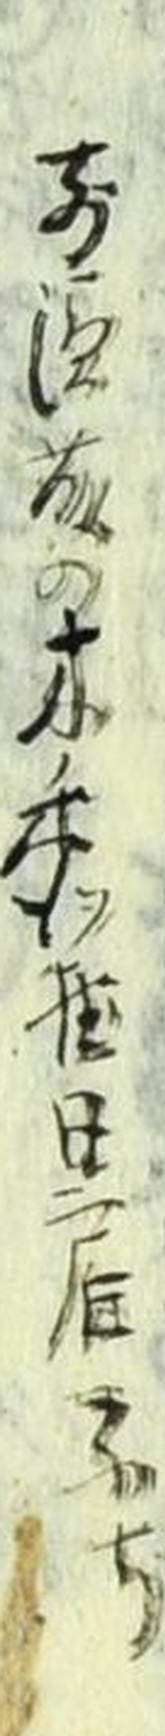前浜藤の木黍ヲ植日雇ふち
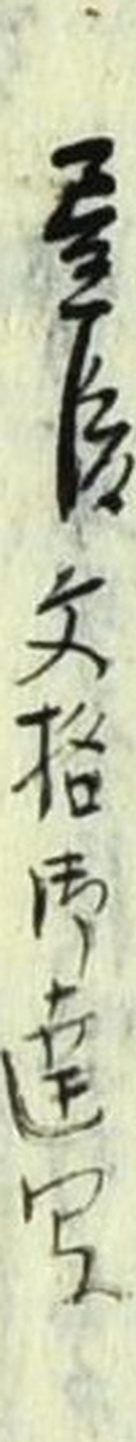昼後文格御達写
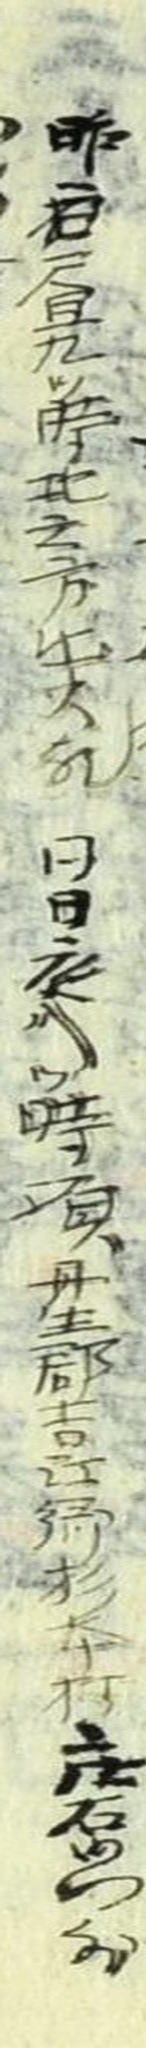昨日昼九ツ時北之方出火歟同日夜八ツ時頃丹生郡吉江郷杉本村庄右衛門外
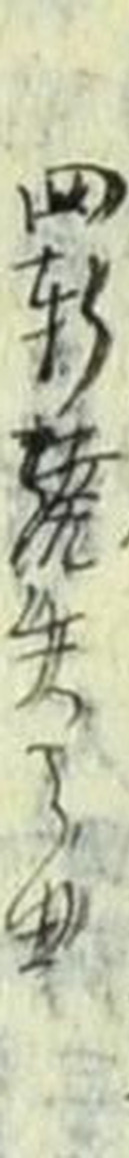四軒焼失之由
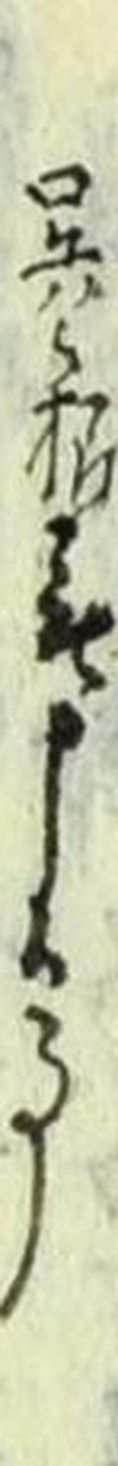呉候様被申候事
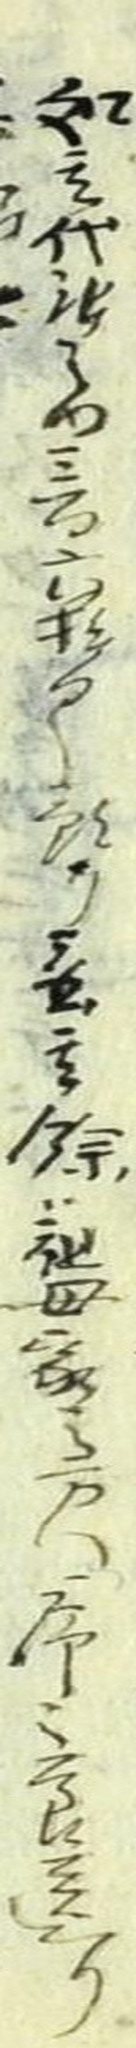処其代銀之内三百六拾匁預り置其余ハ祖母家之方へ序之節送り
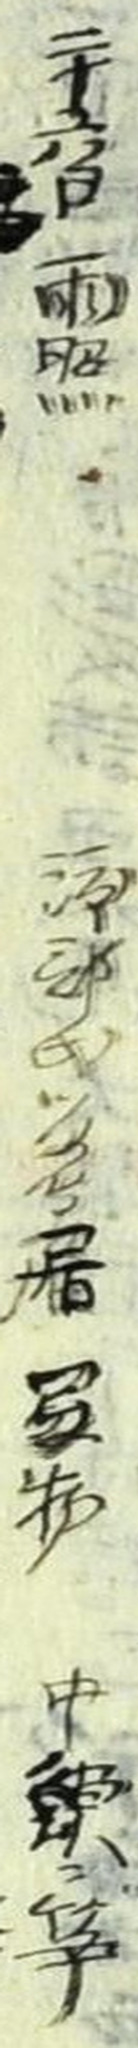二十六日雨照渡部氏留守居写物中鰊ニ笋
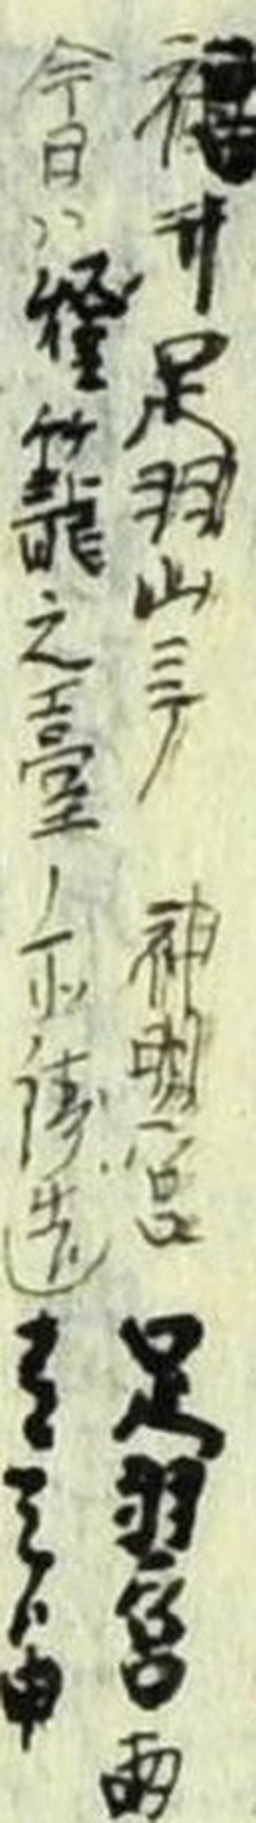今日ハ灯籠之台ノ所鋳造有之候由
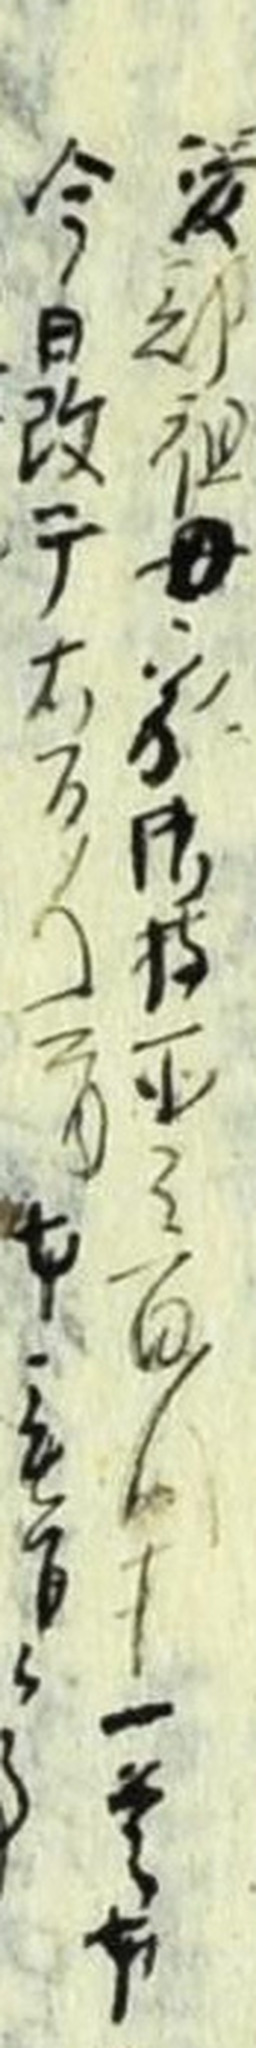今日改テ右百人一首本被召候事
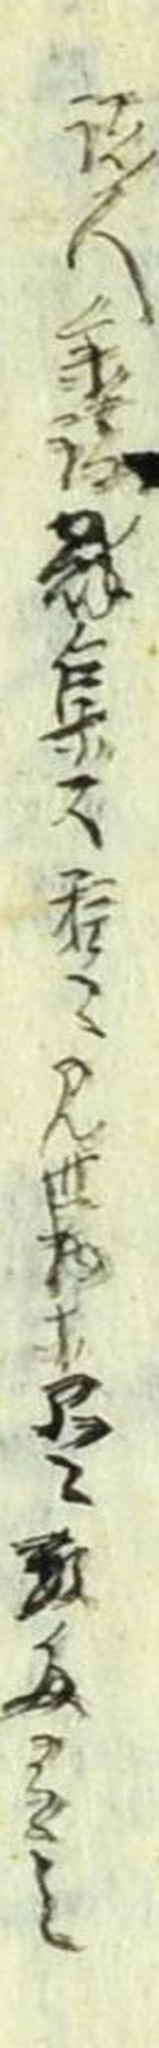諸人参詣群集ス種々見世物等品々数多有之
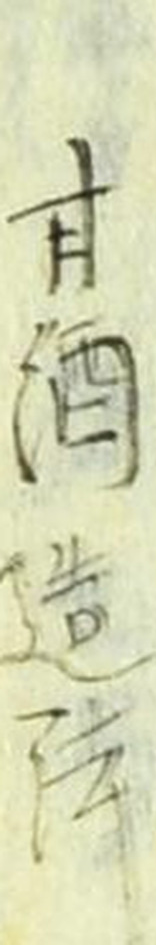甘酒造法
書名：（日記）
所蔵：福井県文書館 Fukui Prefectural Archives
